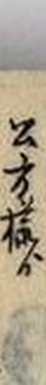公方様ゟ
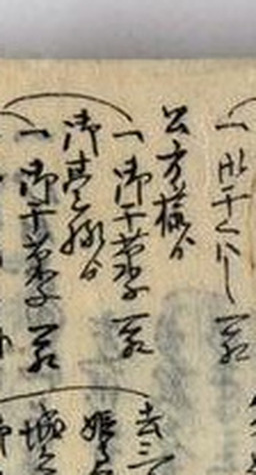一御干菓子一箱
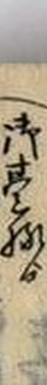御台様ゟ
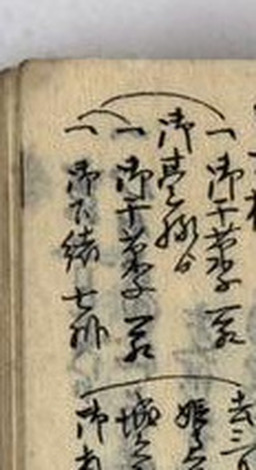一御干菓子一箱

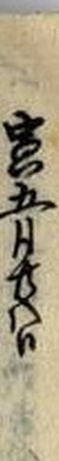寅五月廿八日
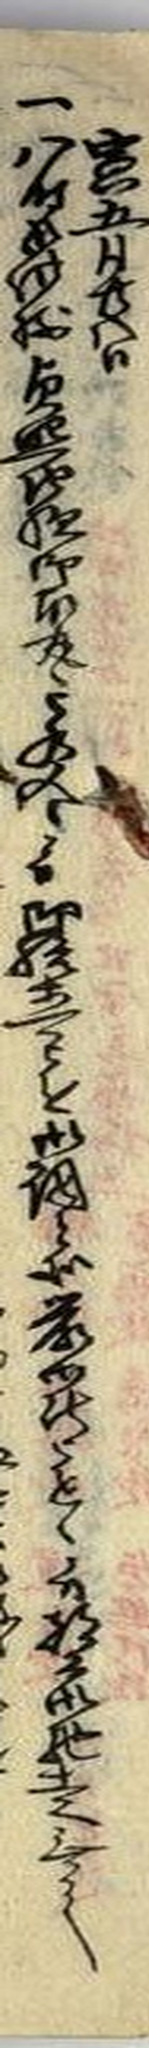一八時御供揃貞照院様御本丸へ被為入候ニ付御膳等可被進御伺候処厳御断被遊候ニ付都而御馳走無之
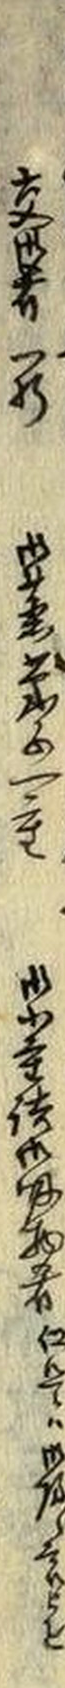交御肴一折御蒸菓子一重御小重詰御吸物肴但是ハ御帰之節被進
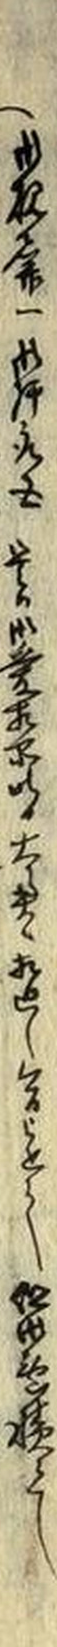御筆立一御扇子六是ハ御愛相品昨日大奥へ相廻し今日被進之但御台積ニて
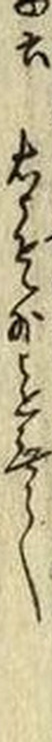右被進之外被進無之
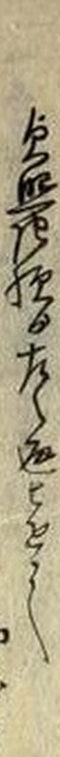貞照院様ゟ左之通被進之
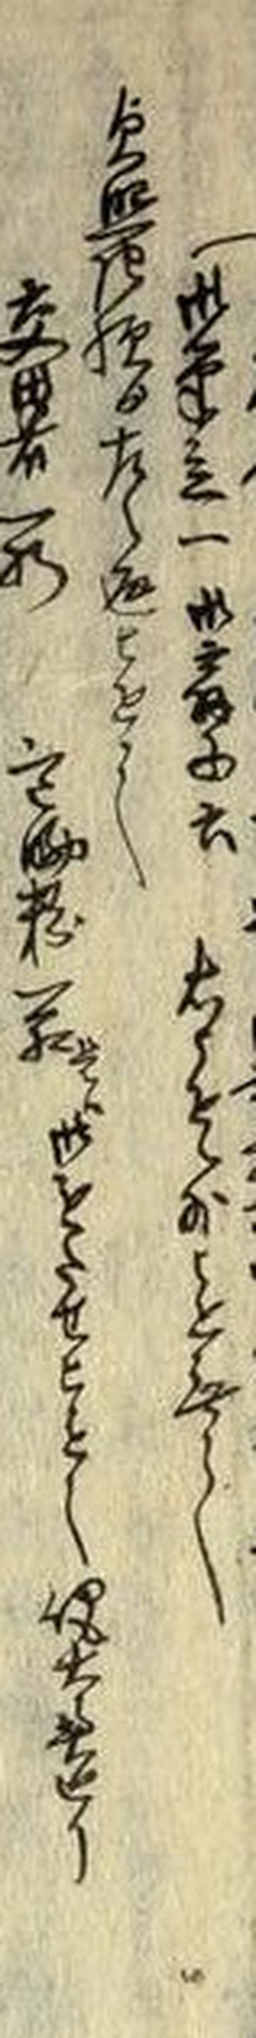交御肴一折寒晒粉一箱是ハ御もたせ被進之総大奥廻り
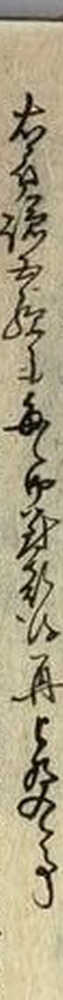右ニ付謙五郎様ニも毎之御対顔後再被為入候事
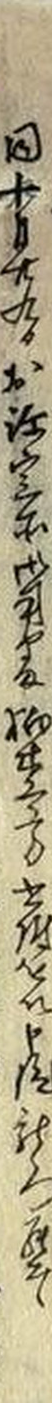同十月廿九日於評定所御用番狛木工方書付を以申渡新右衛門罷出候
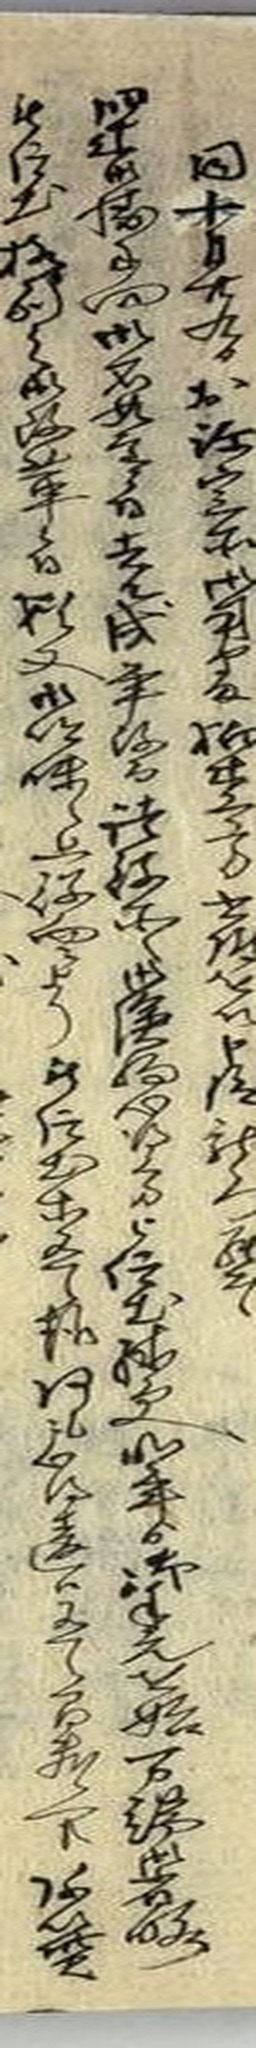被仰出格別之御改革ニ付猶又御吟味之上役向ニより被仰出等有之趣何も心得違ハ有之間敷候へ共弥以質
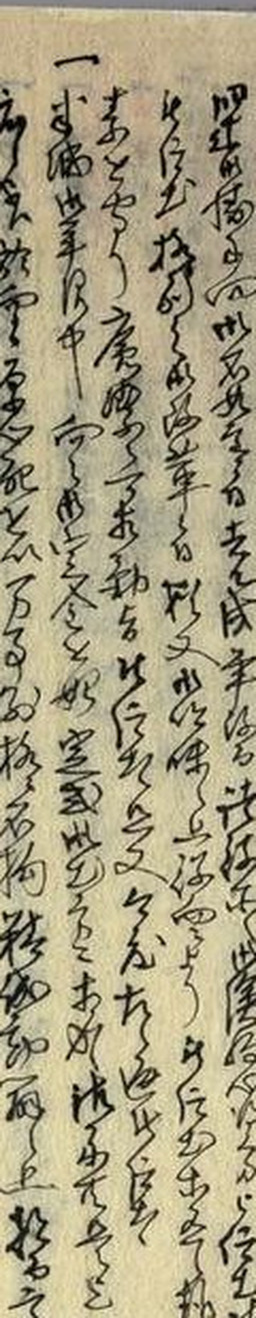素を守り廉潔ニ可相勤旨被仰出候且又今度左之通被仰出候
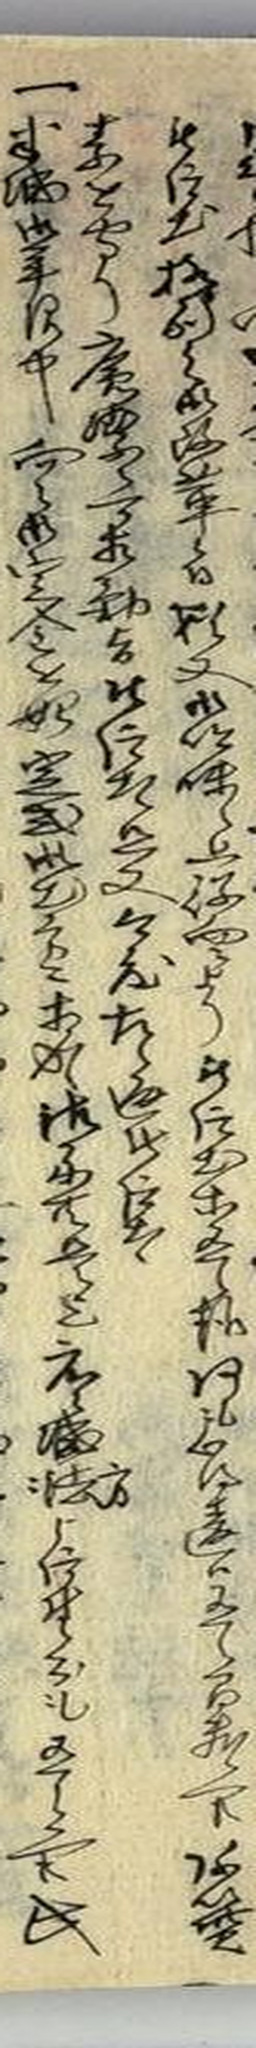一半減御年限中向々御常金を始定式御出方ニ相成候銀米共是迄元々減法被仰付候分も有之候へ共此
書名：少傅日録抄（斉承付側向頭取日記、在国）
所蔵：福井県文書館 Fukui Prefectural Archives
